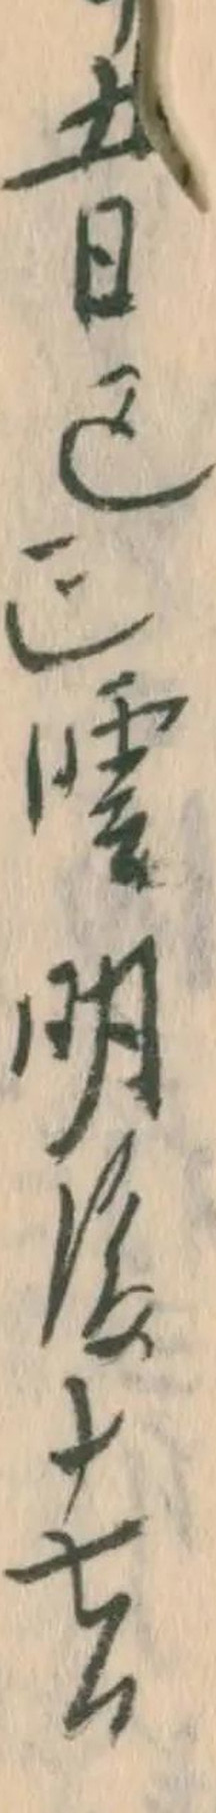十五日己巳曇明後十七日
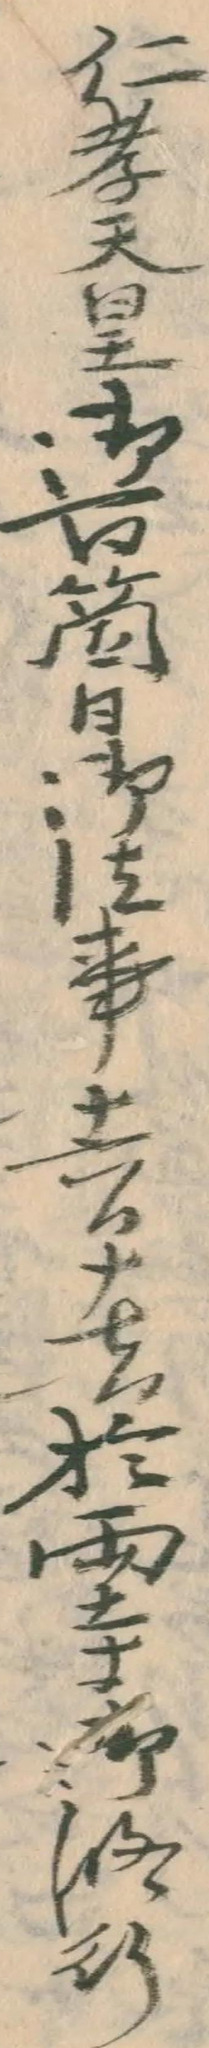仁孝天皇御百箇日御法事十六日十七日於両寺御修行
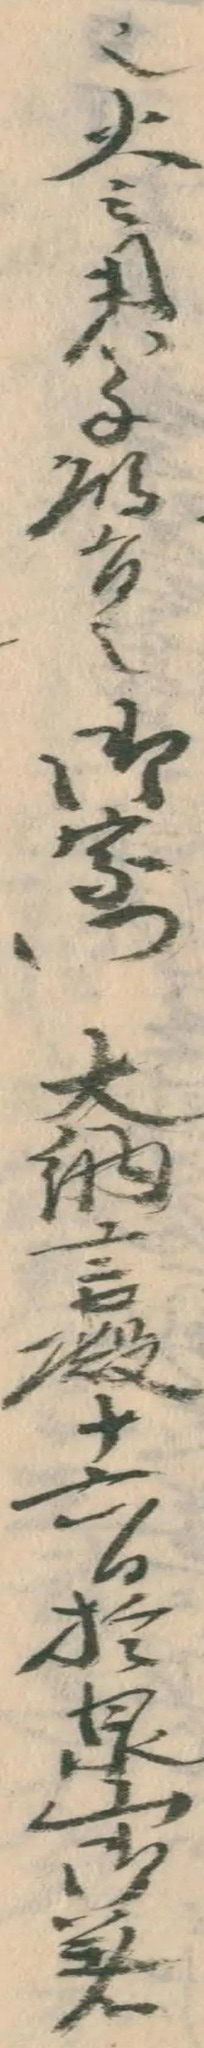也火之用心手觸有之御家門大納言殿十六日於泉山御着
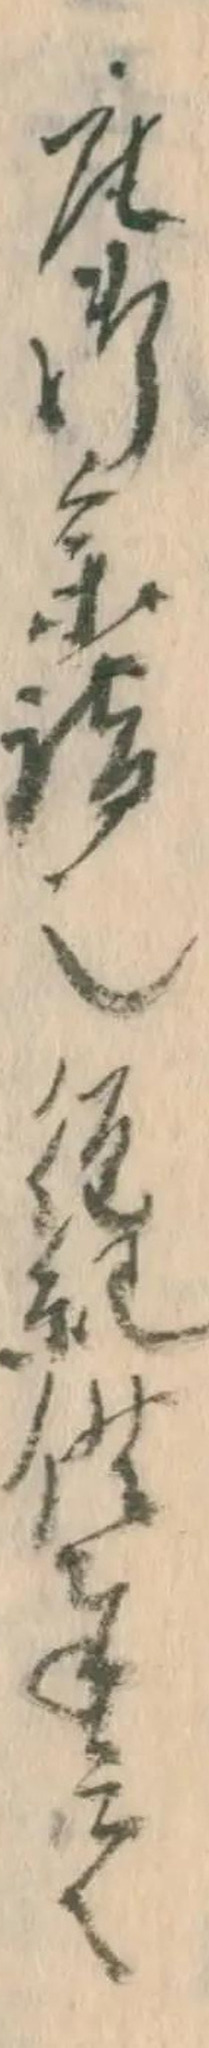座御参詣也経紀供奉也
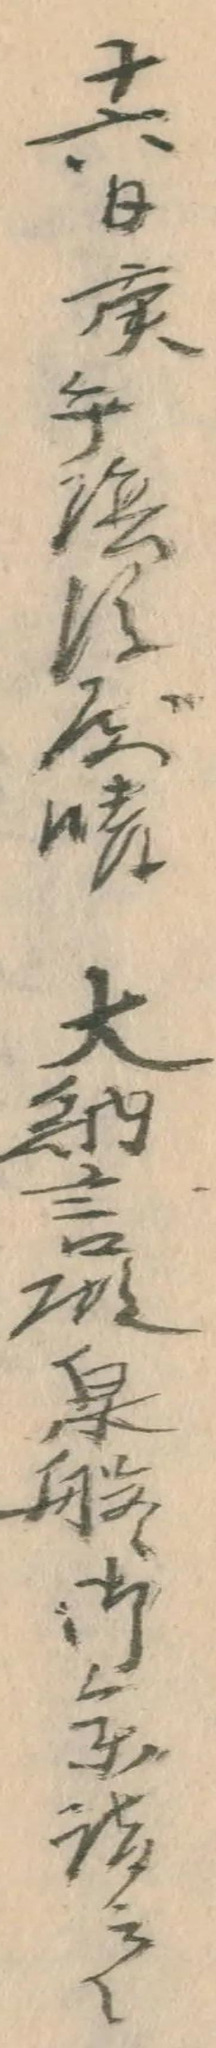十六日庚午陰後属晴大納言殿泉般へ御参詣云々
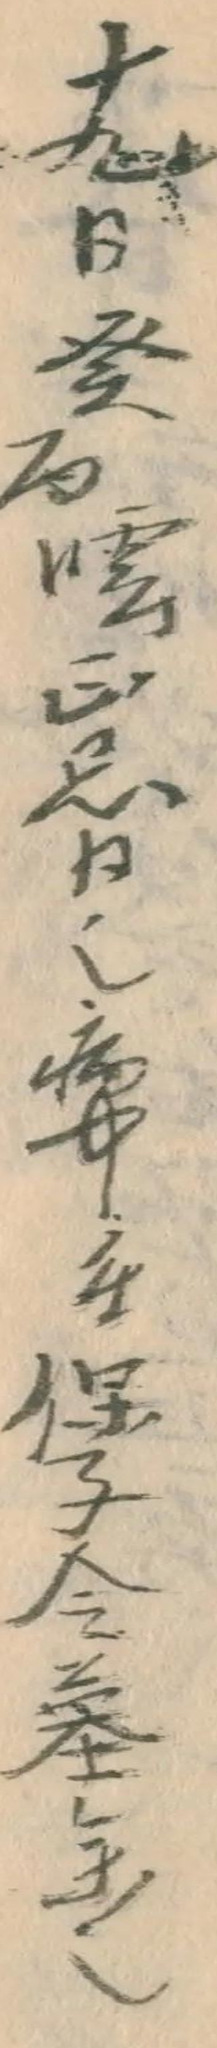十九日癸酉曇正忌有也病中ニ付保子令墓参也
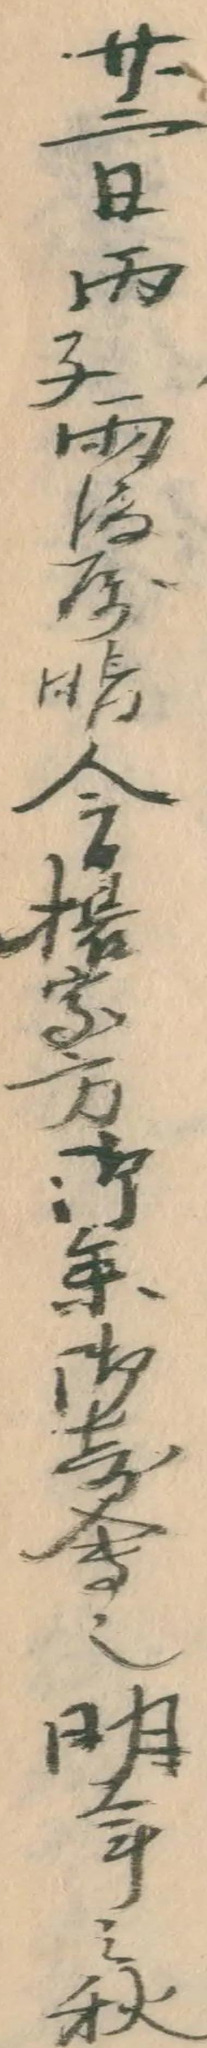廿二日丙子雨後属晴今日摂家方御参御寄會也明年之秋

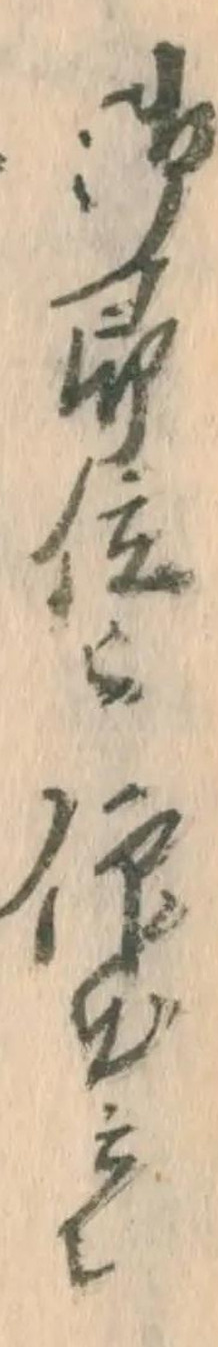御即位被仰出云々
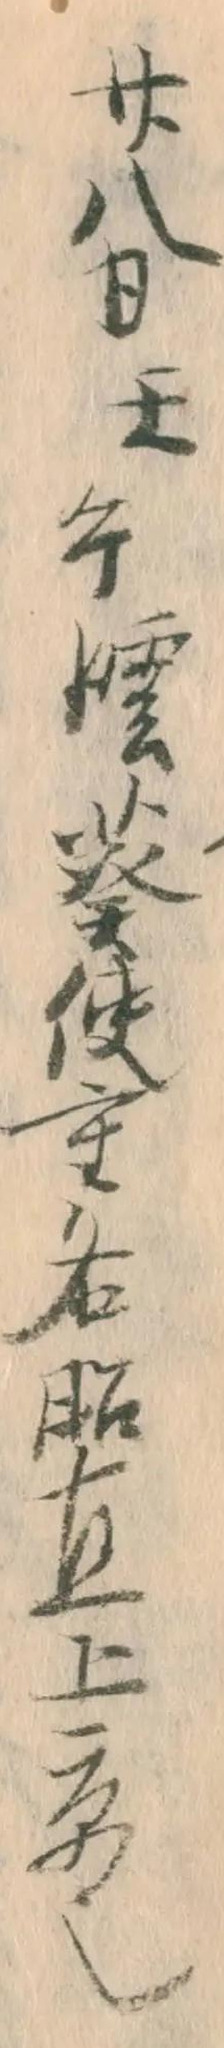廿八日壬午曇葵使重名昭直上京也
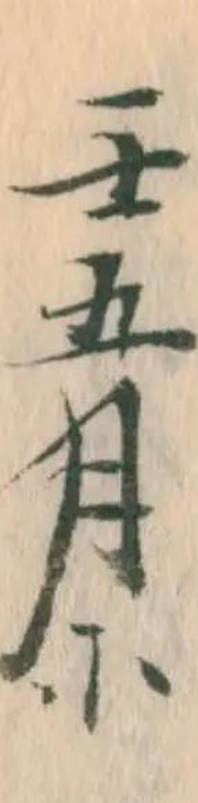壬五月小
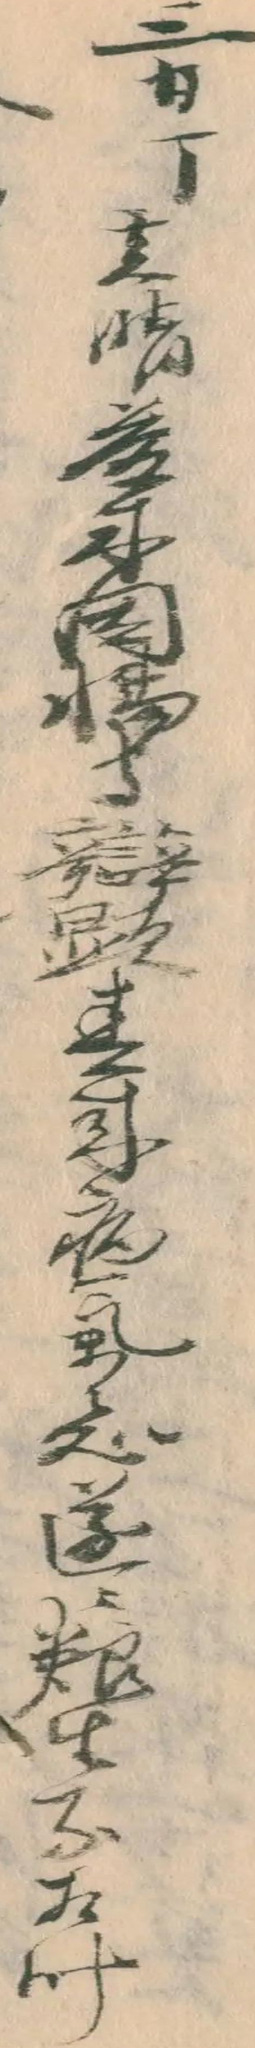三日丁亥晴藤木因幡守辨顕春来病氣候処遂に粮生不相叶
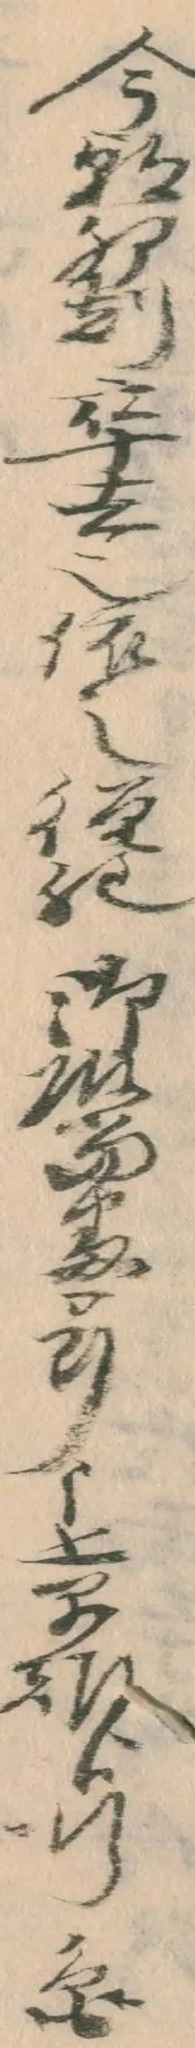今朝卯刻卒去也依之経紀御殿當番御引申上早朝ゟ行参
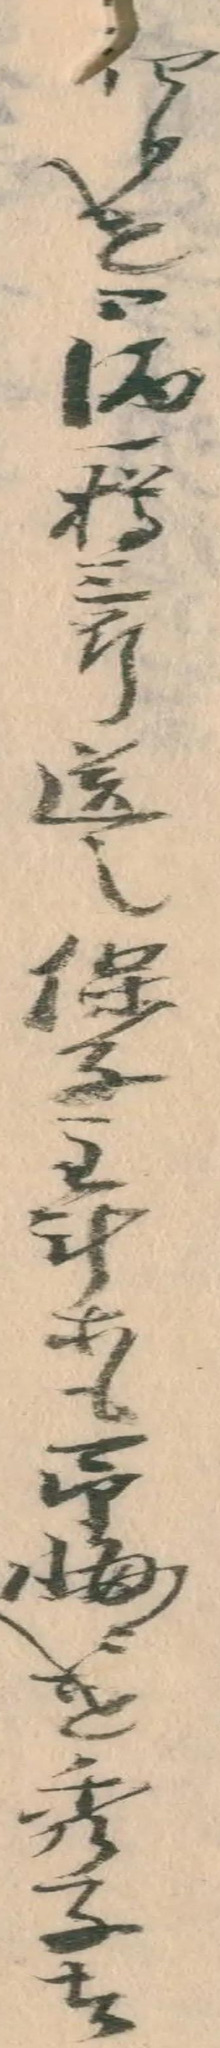仕り遣御酒一樽三升送之保子主斗等も弔悔ニ遣秀子は
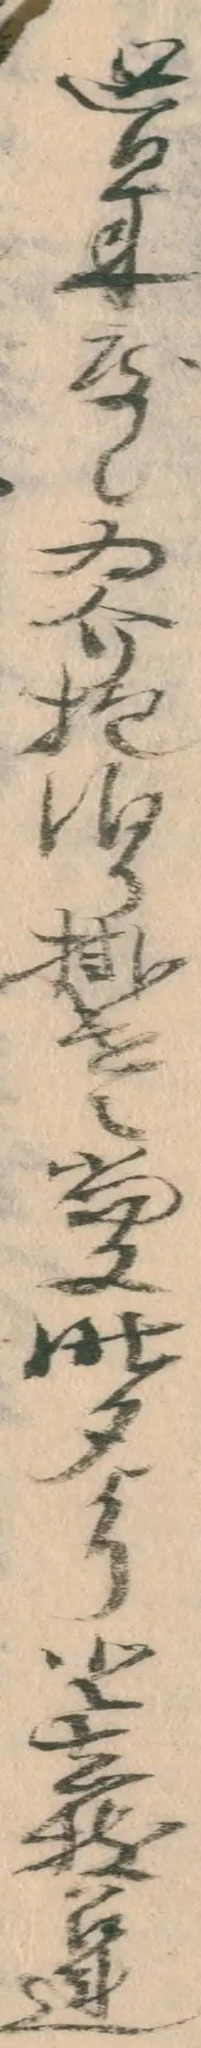過日来度々為介抱泊り掛遣し尚又昨夕より登志枝召連
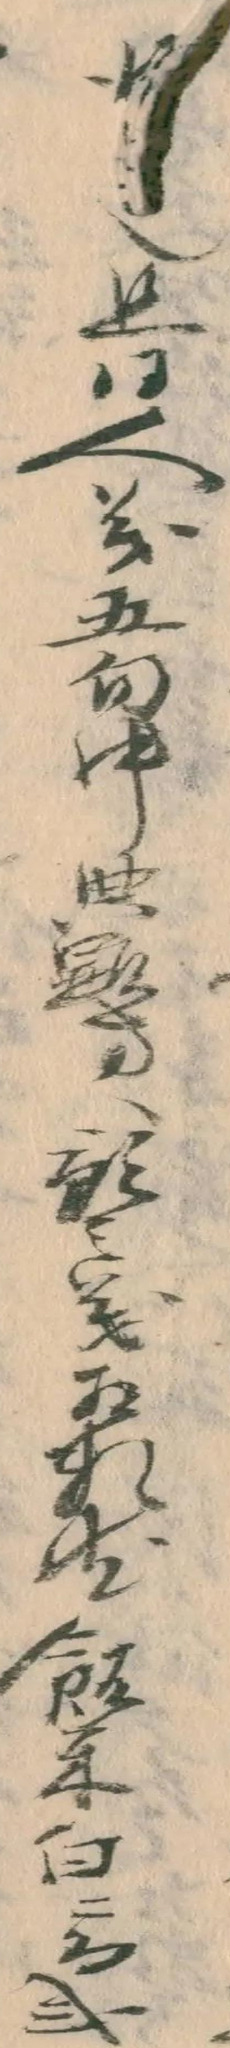也且同人義五旬中典顕方へ預之義相頼尤飯米白ニ而弐
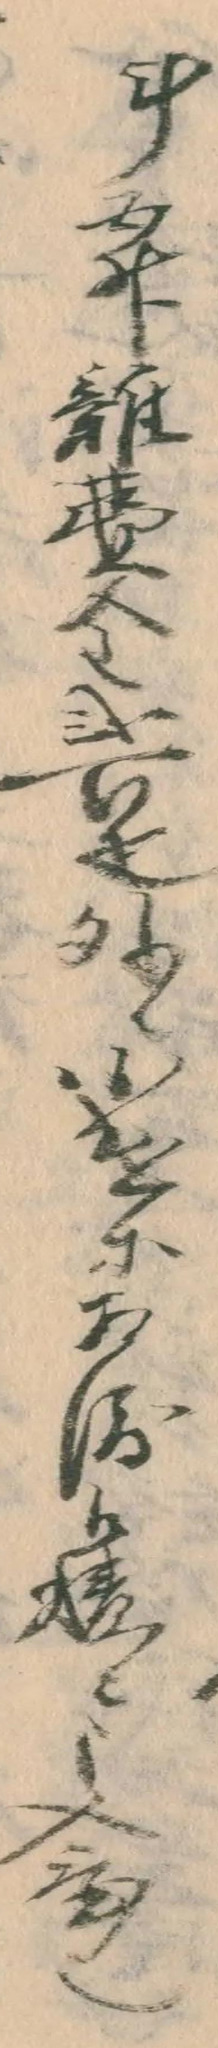斗五升雑費金弐百疋外へ小遣等相渡候積ニ申入置也
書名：賀茂社記録. 第70冊
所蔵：国立国会図書館 National Diet Library, JAPAN
